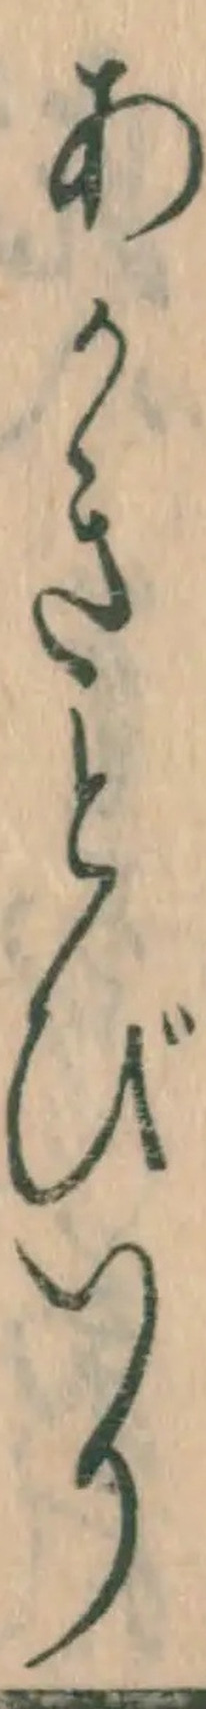あかきとびいり
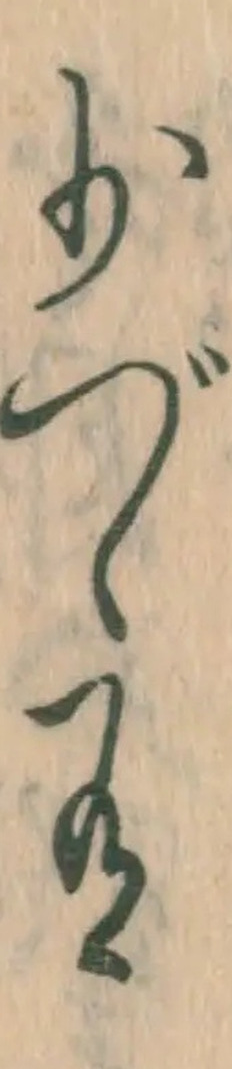少づゝ有
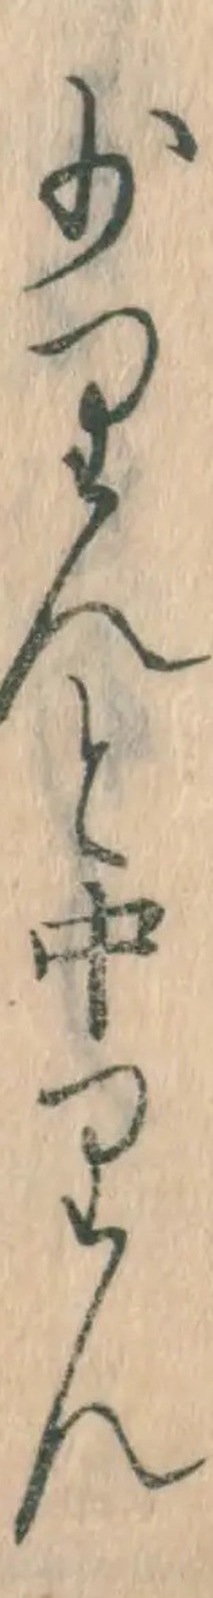少りんと中りん
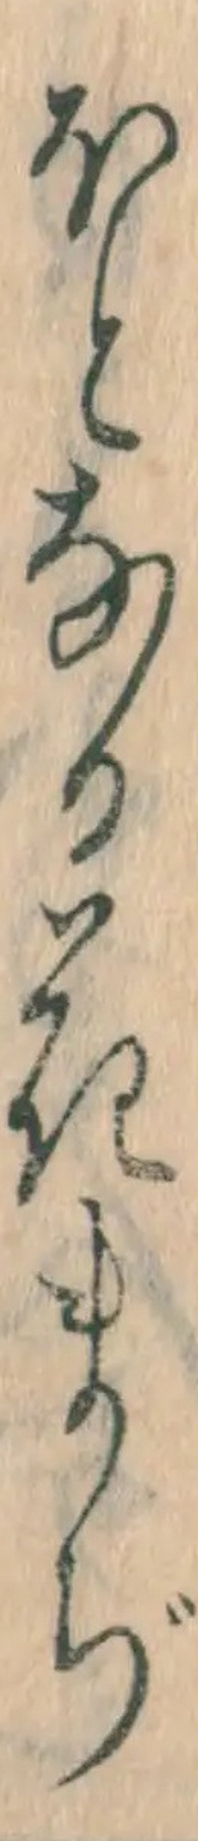ほとなる花まぢ
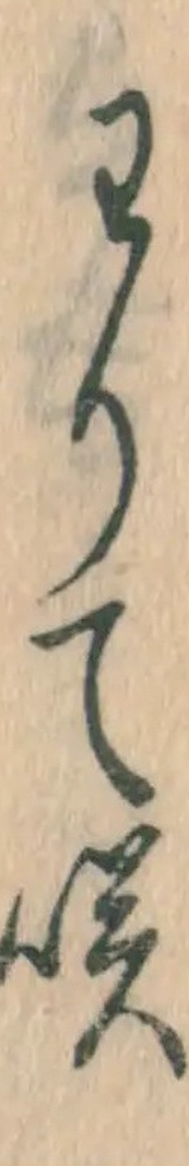わりて咲

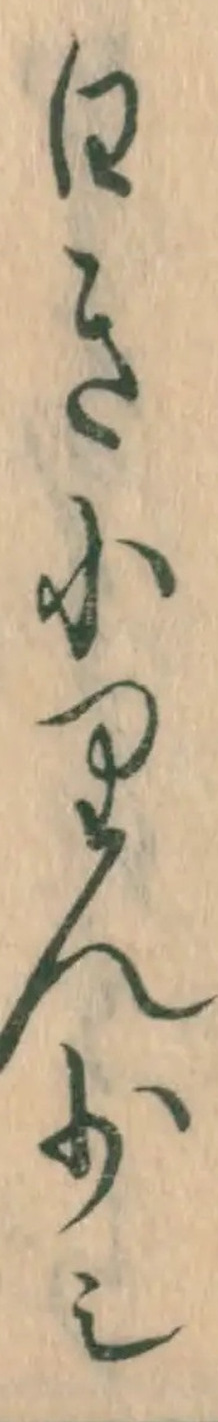白き小りん少し
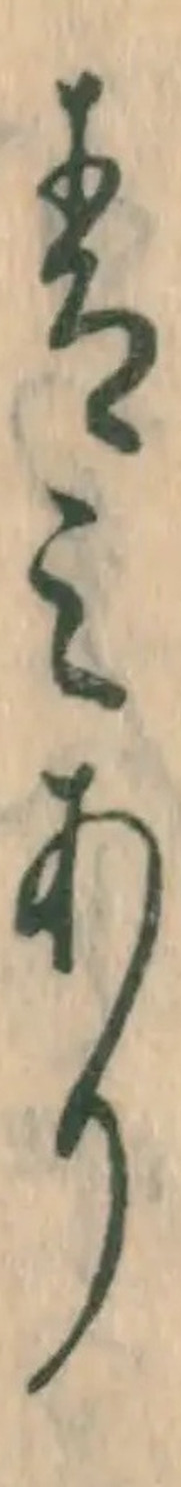青みあり
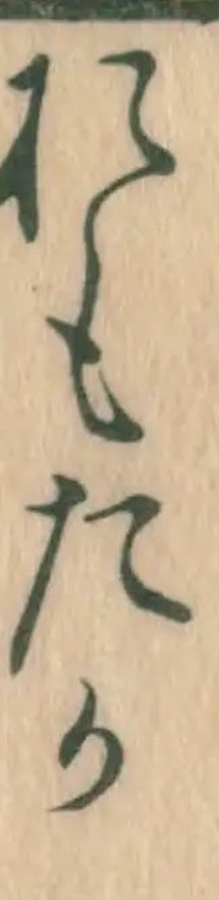おもたか
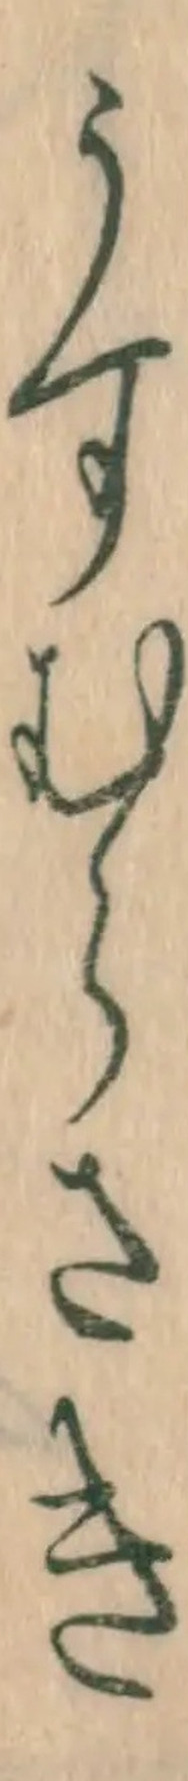うすむらさき
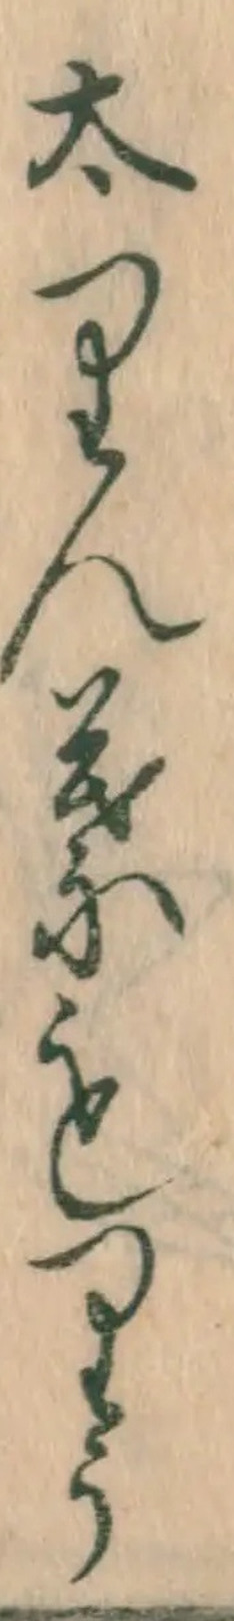太りん葉もりう
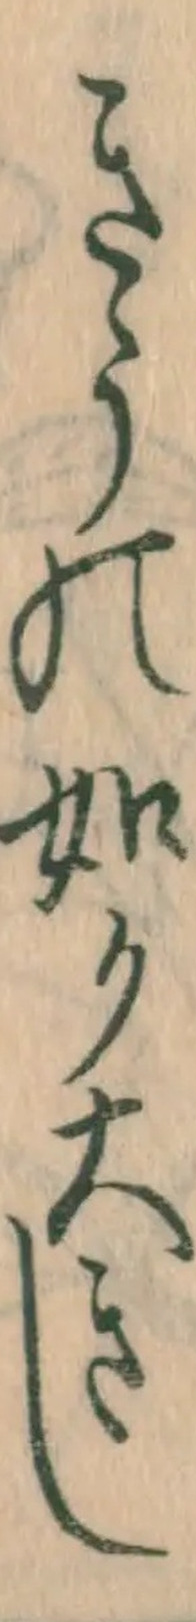きうの如く大きし
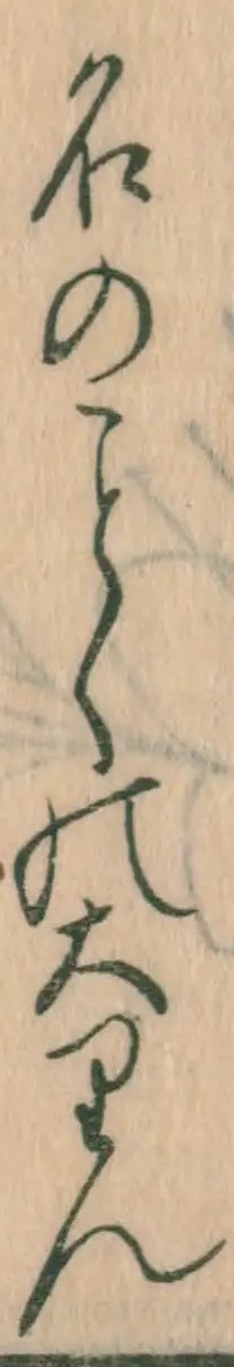名のことくの大りん
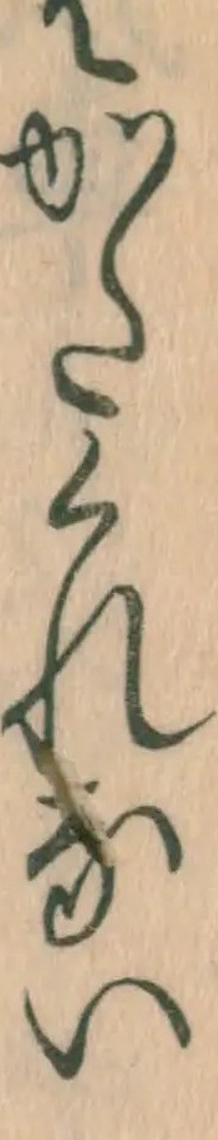はかたくれない
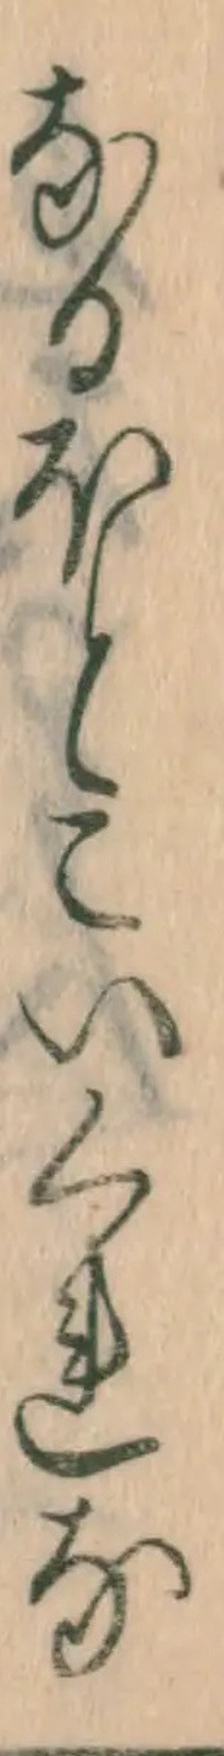なるほとこいくれな
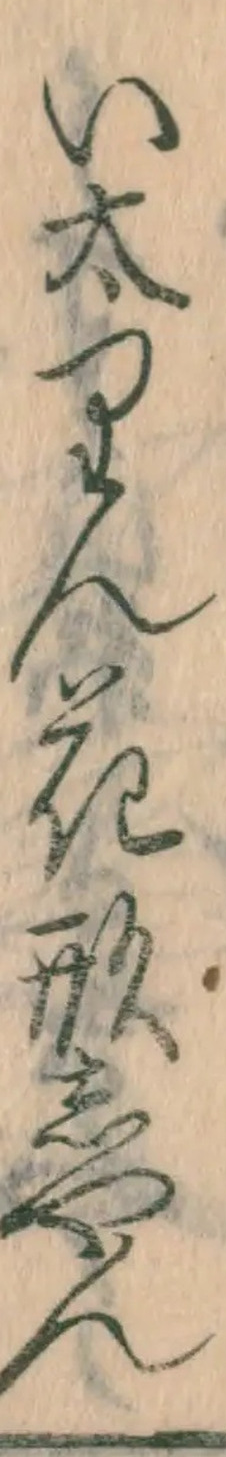い太りん花形しやん
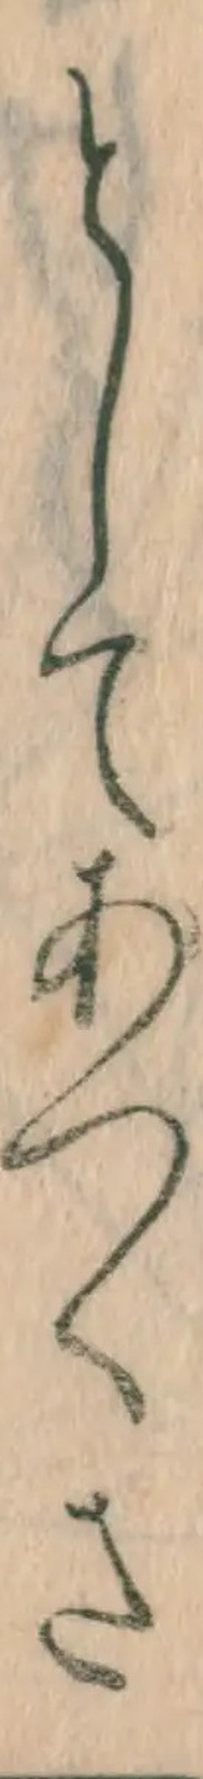としてあつくさ
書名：錦繍枕 5巻. [4]
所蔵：国立国会図書館 National Diet Library, JAPAN
